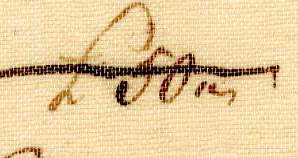[£50,]
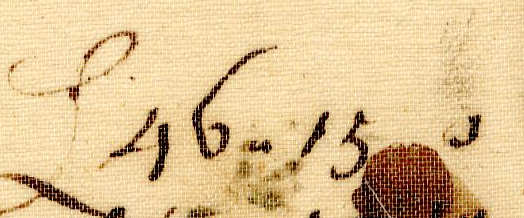£46..15 0
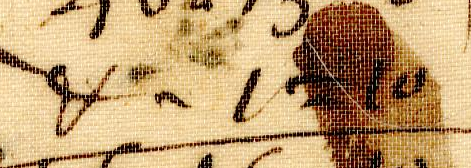&- 1-10
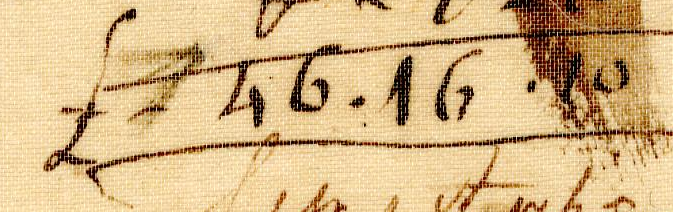£ 46.16.10
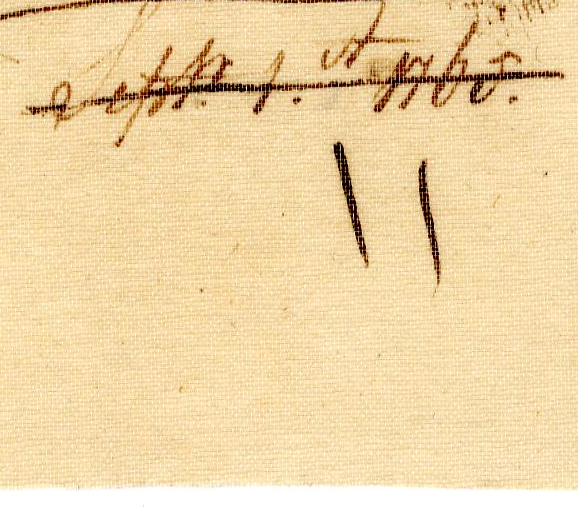[Sept.^r 1^st. 1765]
